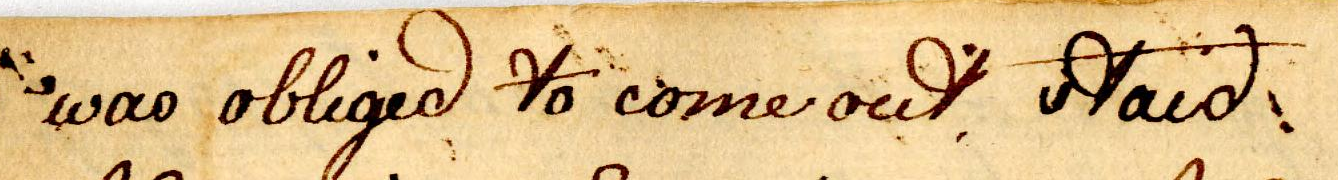was obliged to come out staid
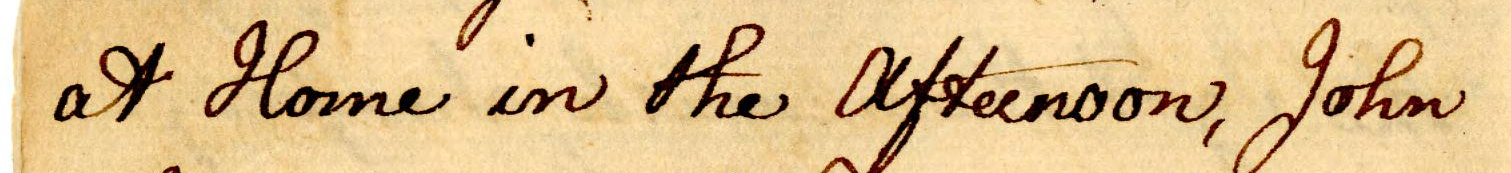at Home in the Afternoon, John
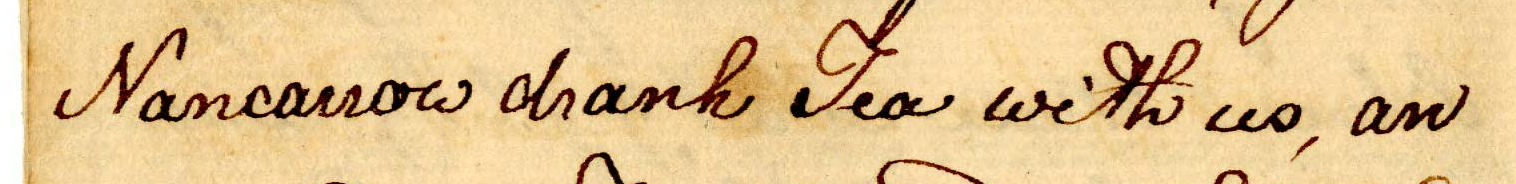Nancarrow drank Tea with us, an
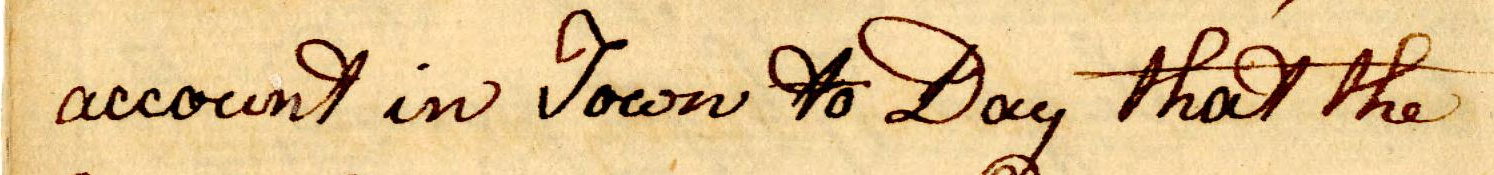account in Town to Day that the
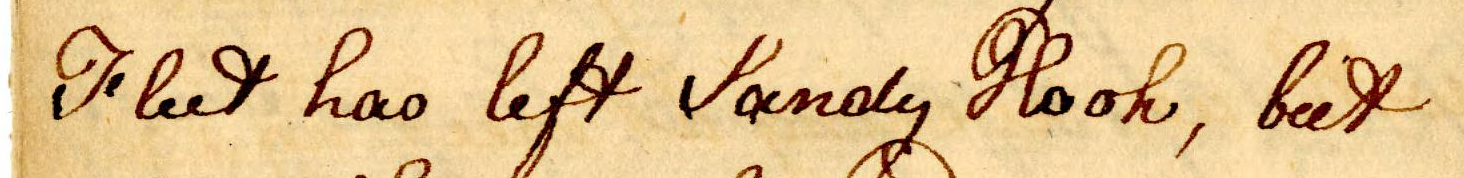Fleet has left Sandy Hook, but
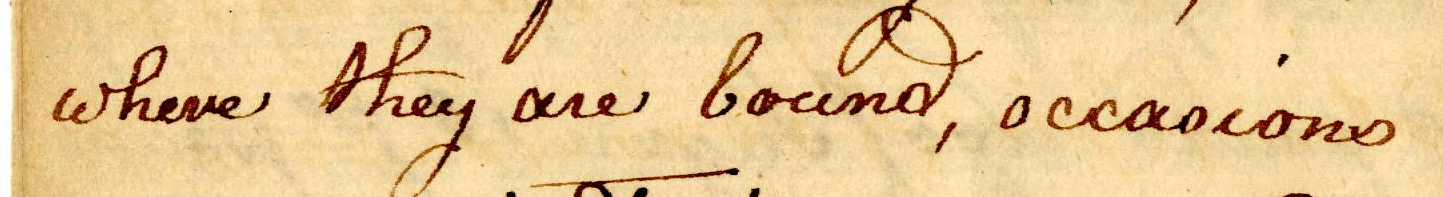where they are bound, occasions
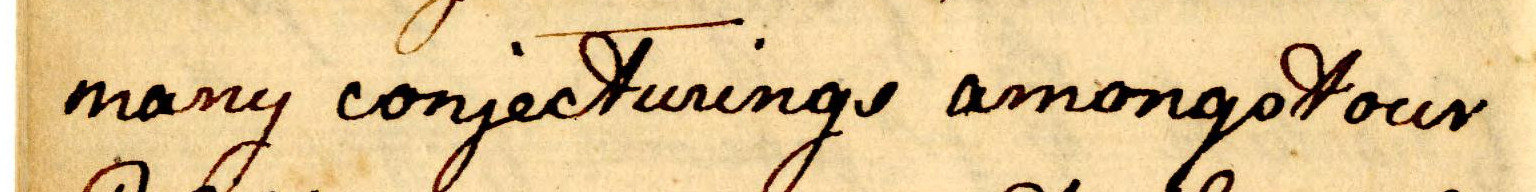many conjecturings amongst our
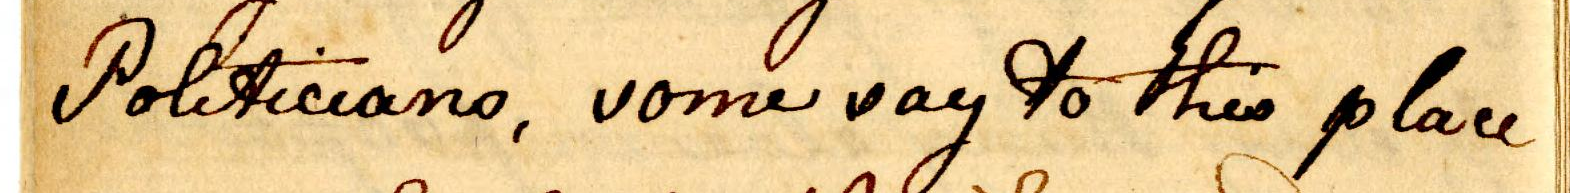Politicians, some say to this place
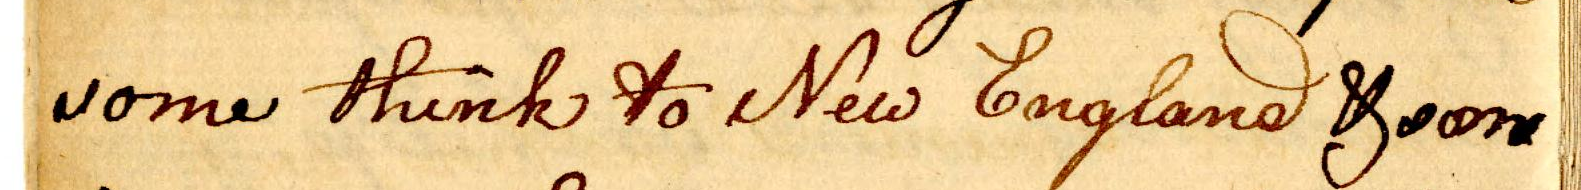some think to New England & some
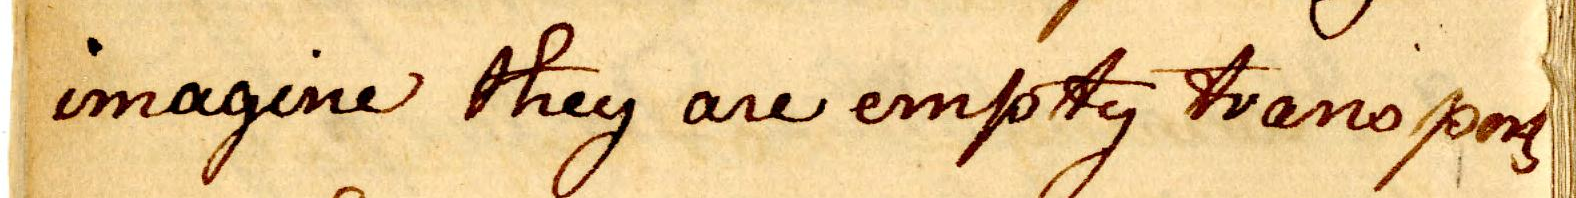imagine they are empty transport
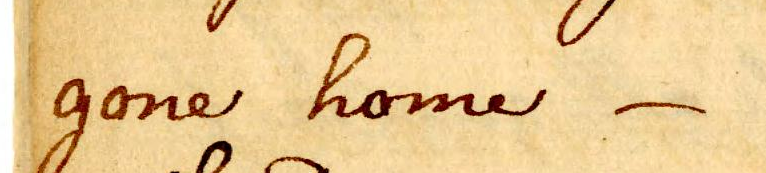gone home-
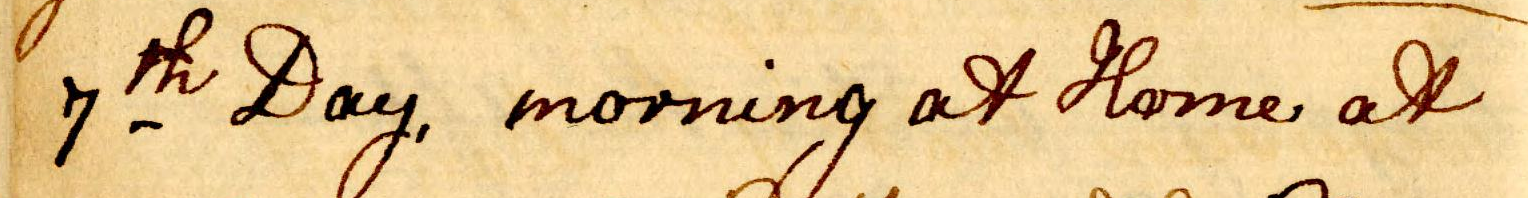7^th Day, morning at Home at
